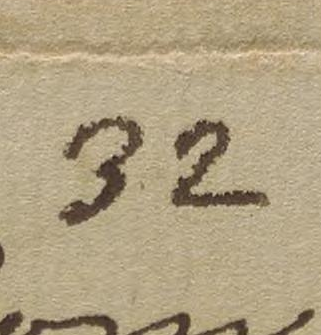32
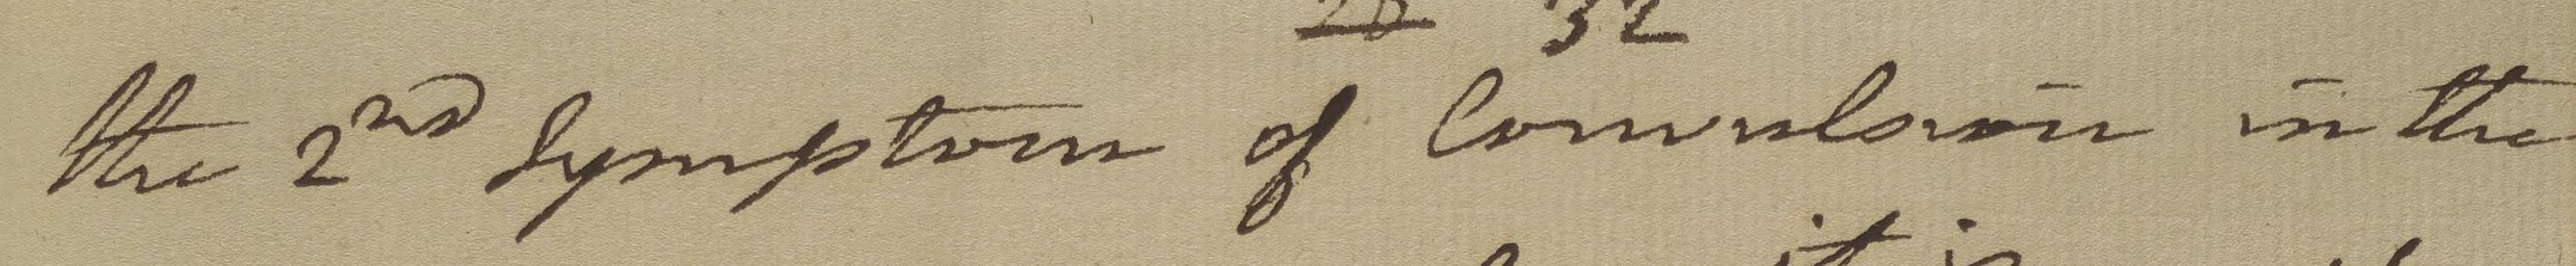the 2nd symptom of convulsion in the
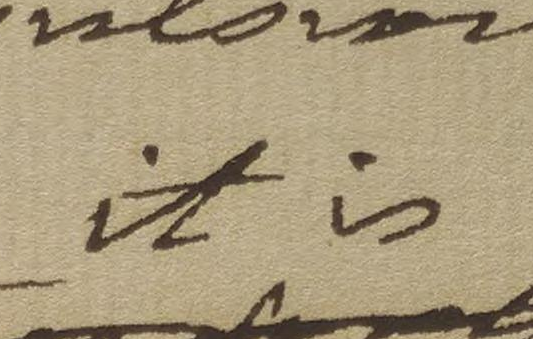it is
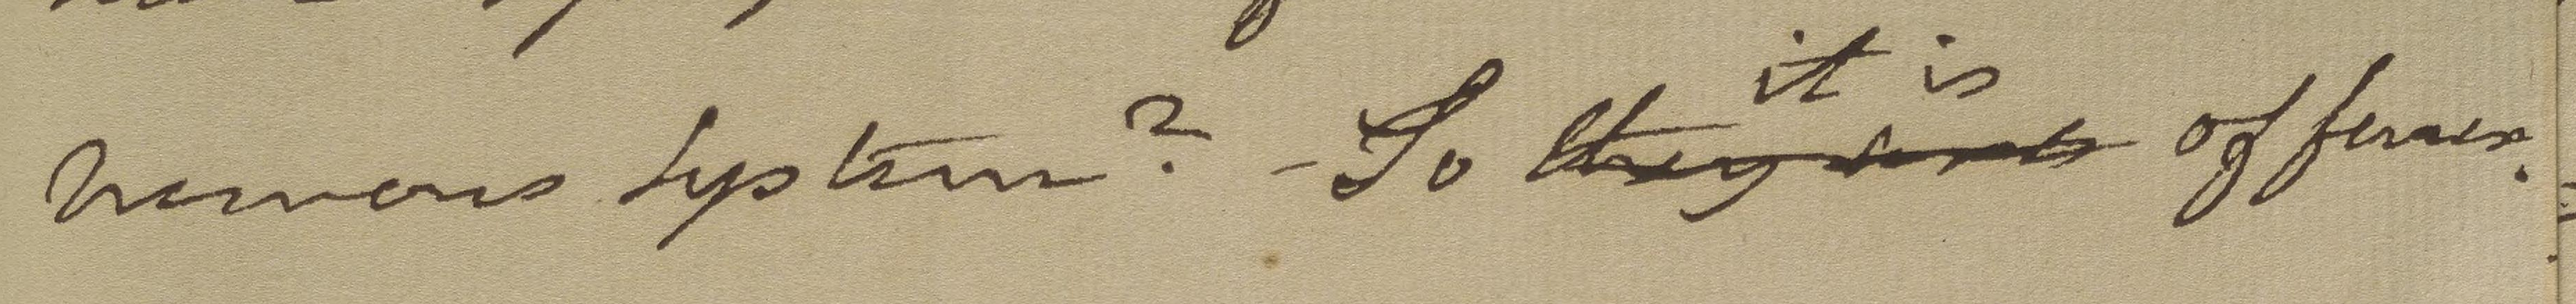nervous system? So [they ____] of fever.
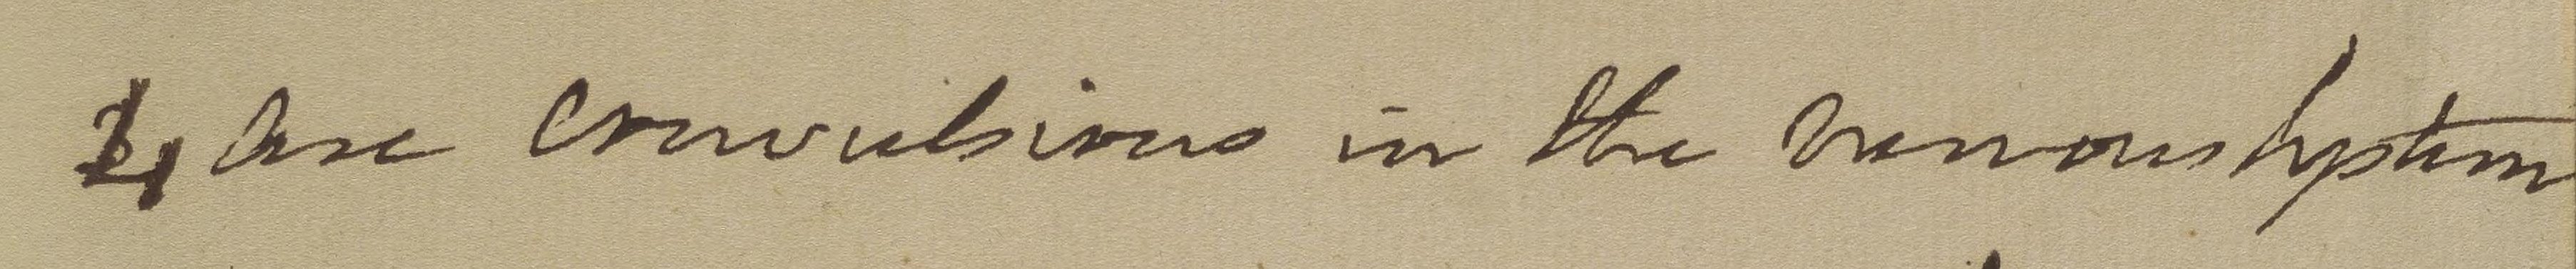4 Are convulsions in the nervous system
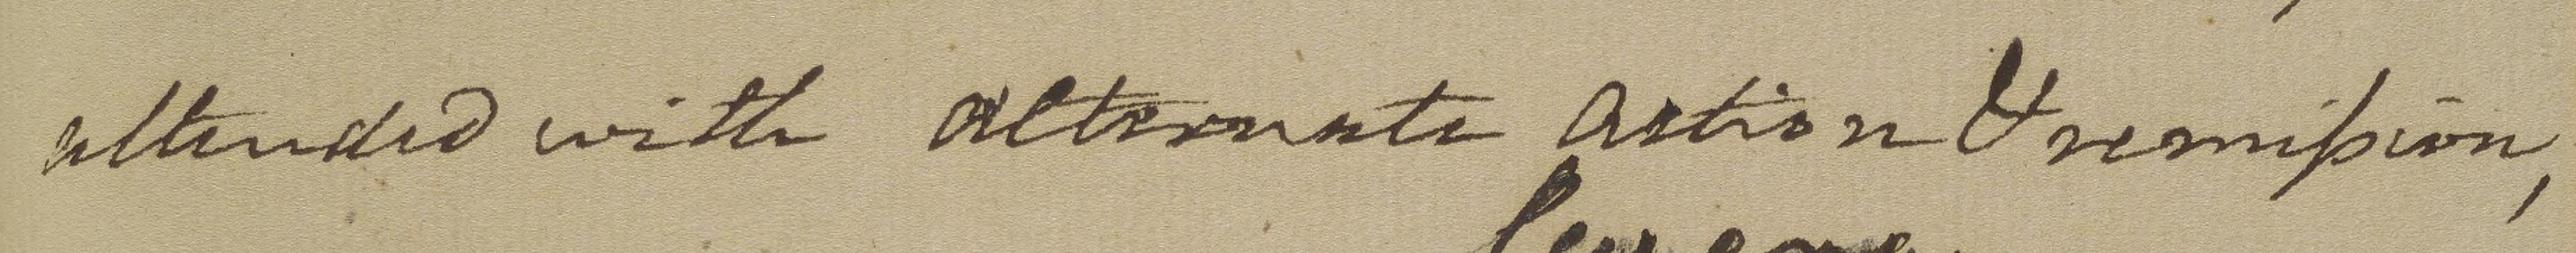attended with alternate action & remission,
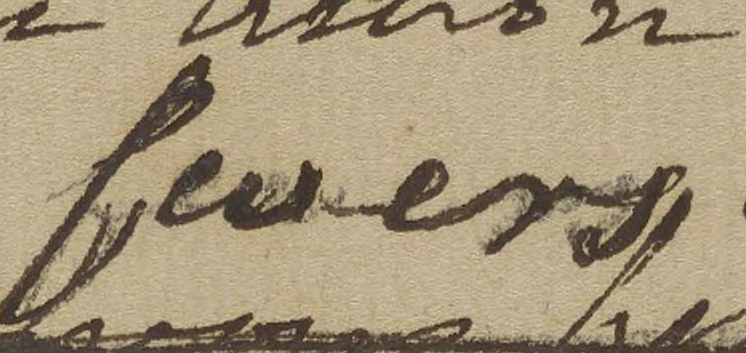fevers.
